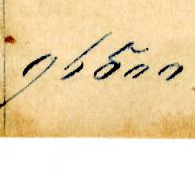6500
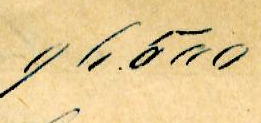£6.500
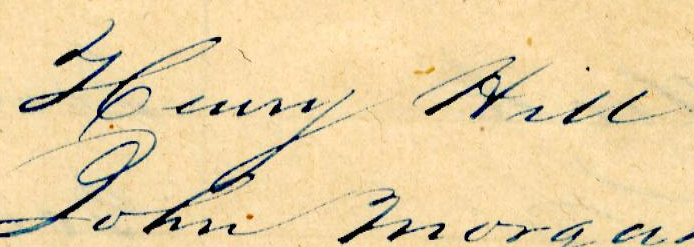Harry Hill
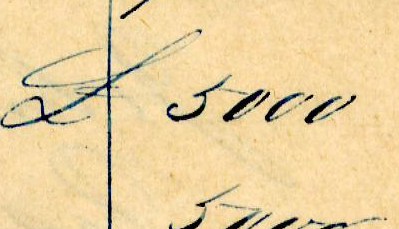£5000
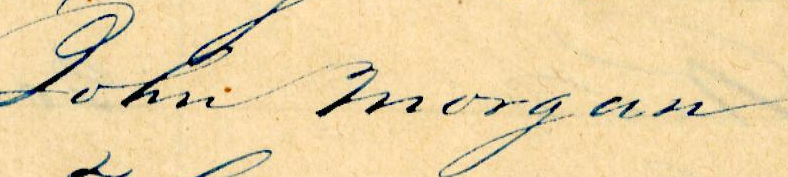John Morgan
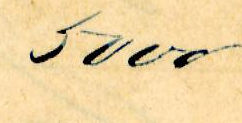5000
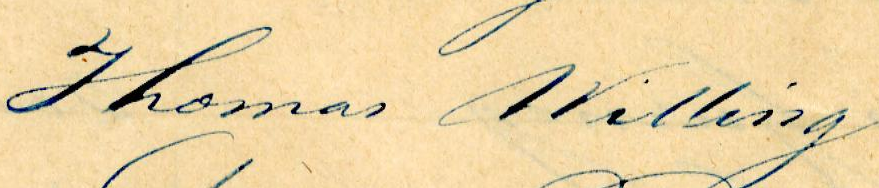Thomas Willing
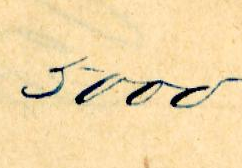5000
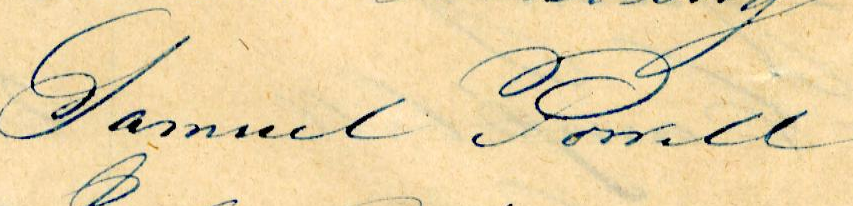Samuel Powell
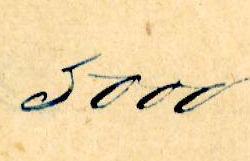5000
